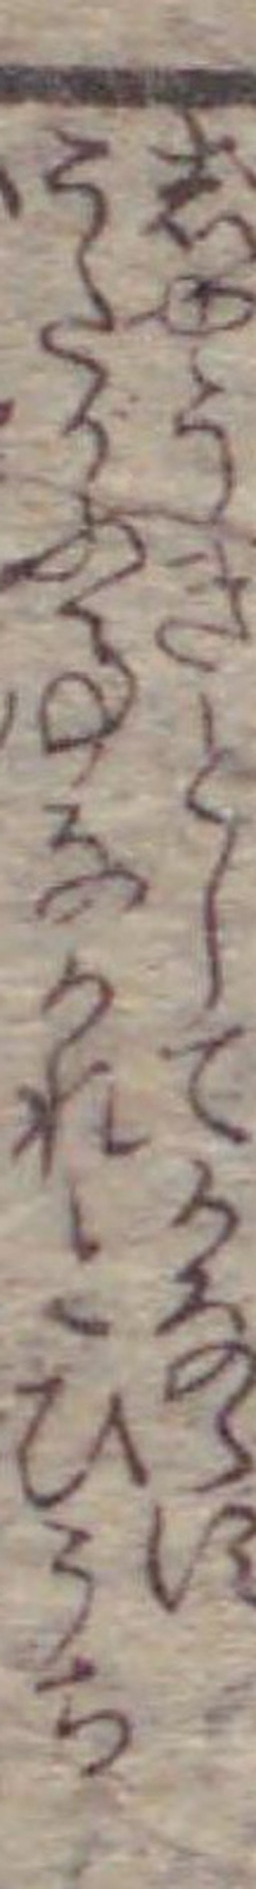うたがふ事なかれとひうち
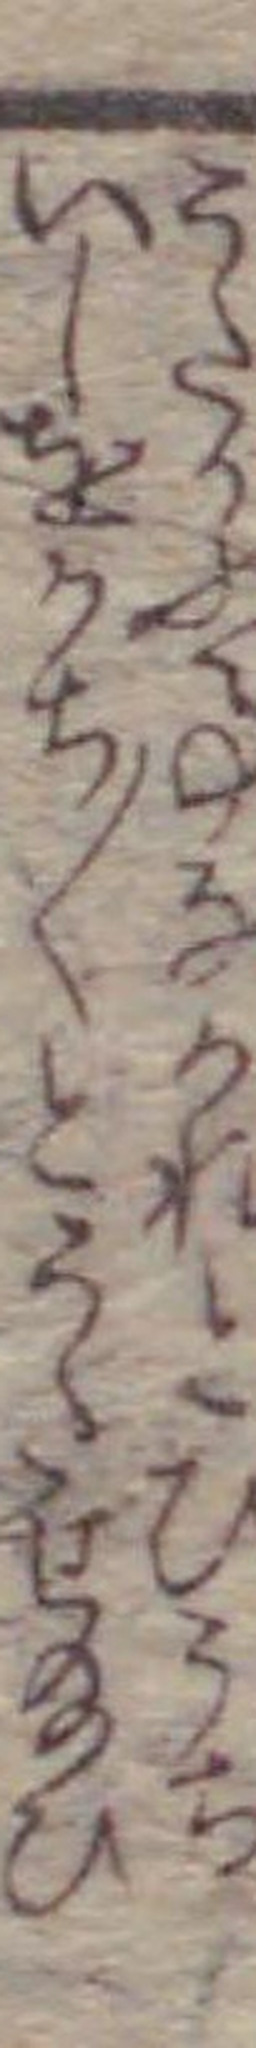いしをかち〳〵とうたせ給ひ
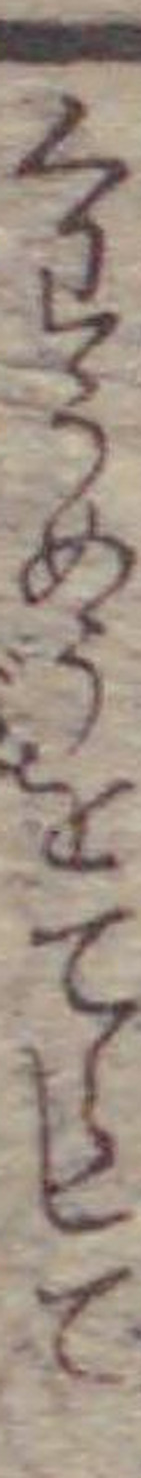くわうめうをてらして
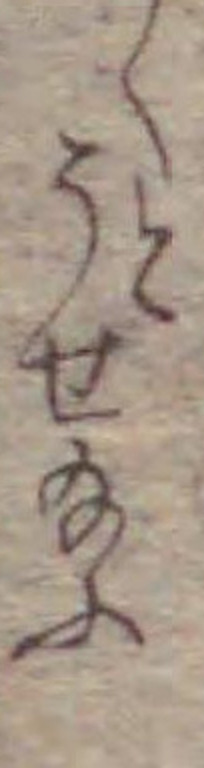うせ給ふ

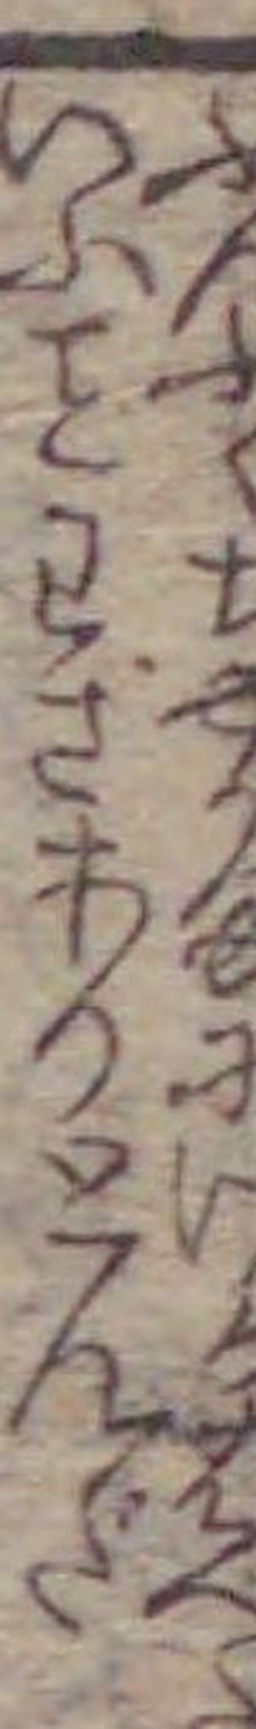おふことわざありとんだ
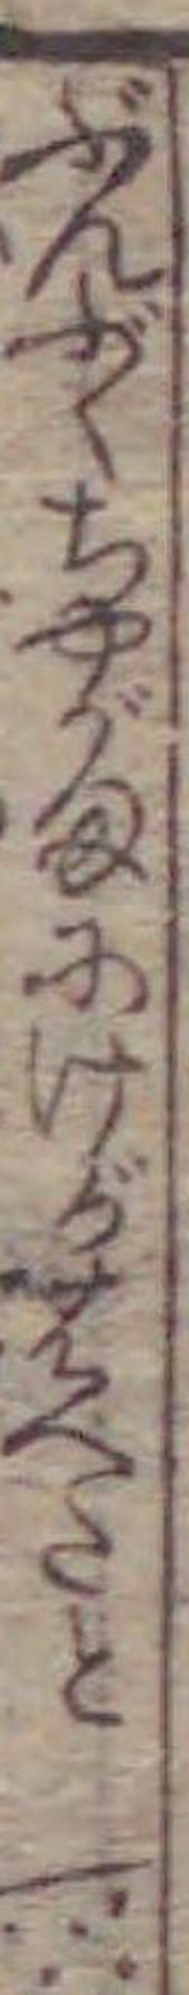ぶんぶくちやがまにけがはへたと
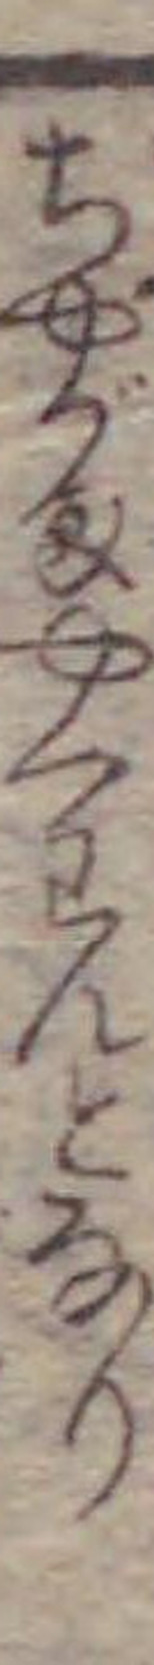ちやがまやくわんとなり
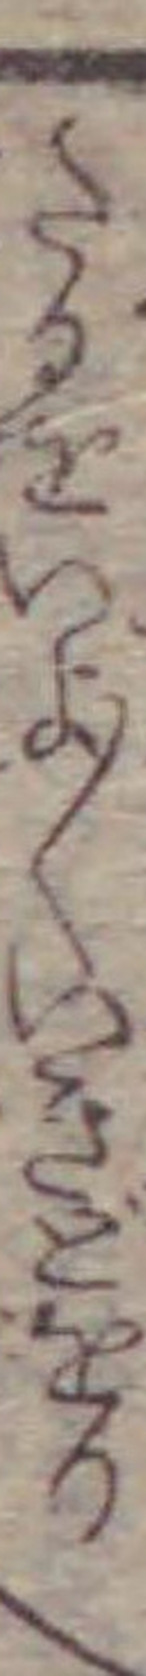たるをいよ〳〵いきどをり
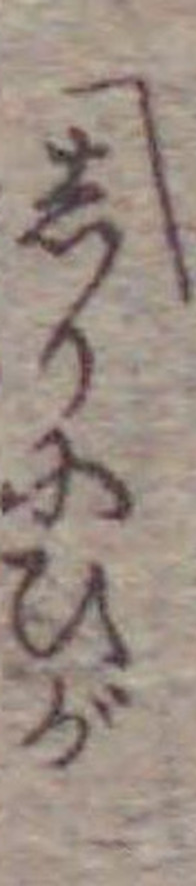〽しりにひが
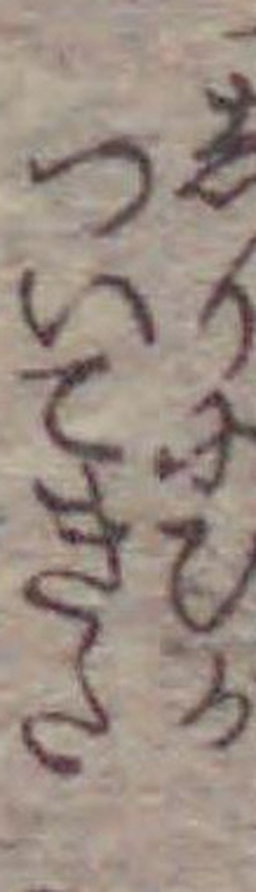ついてきた
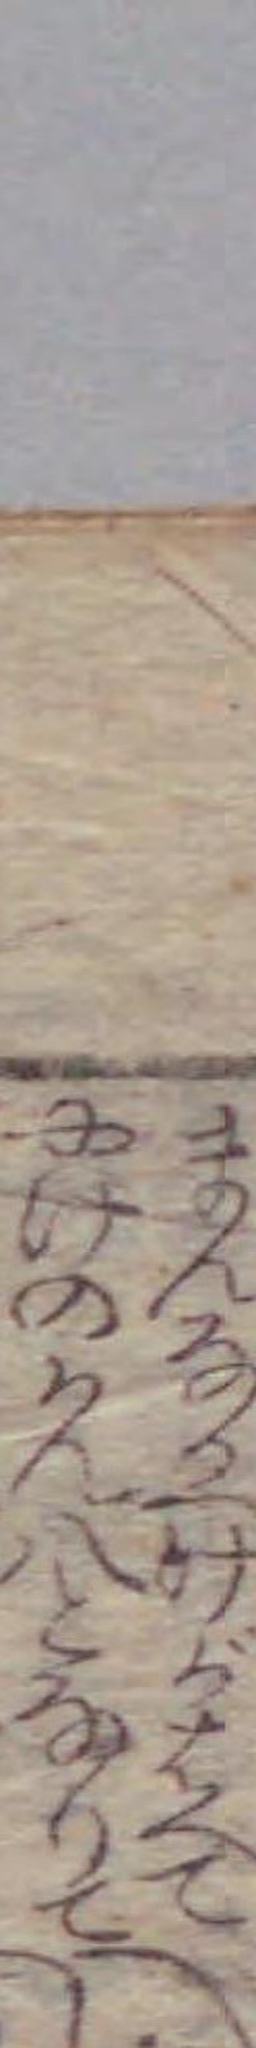やけのかん八となりて
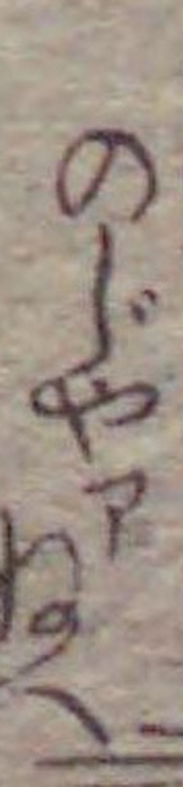のじやァねへ
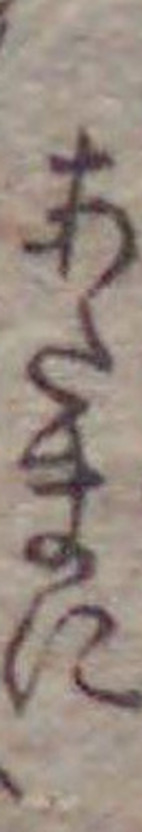あたまに
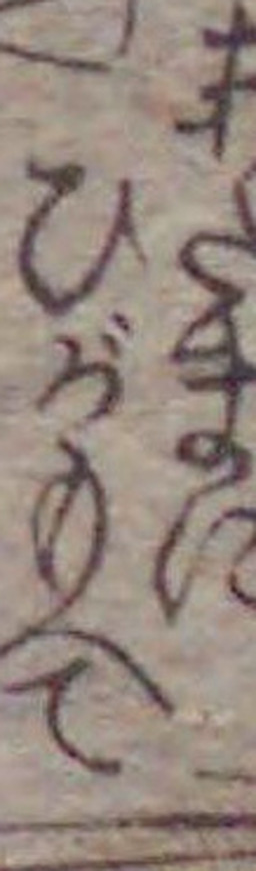ひがもへて
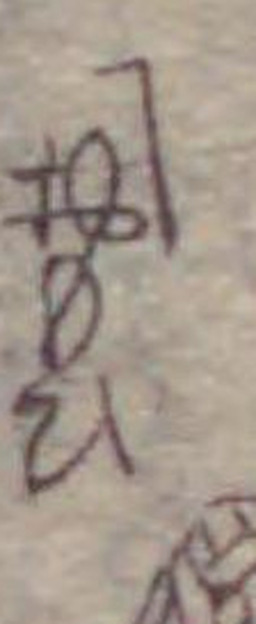〽おもひ
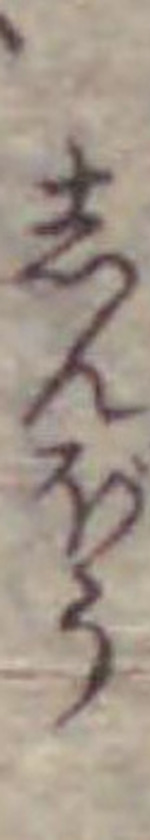しんぼう
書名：万物小遣帳 : 2巻
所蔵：国立国会図書館 National Diet Library, JAPAN
